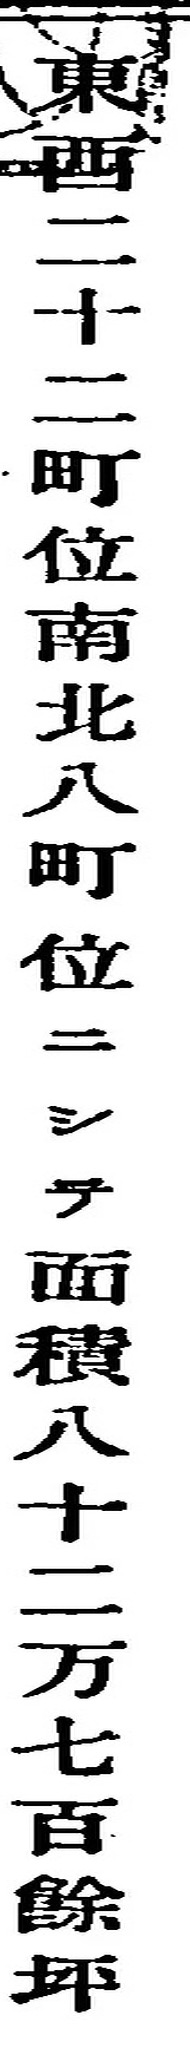廣袤東西二十二町位南北八町位ニシテ面積八十二万七百餘坪
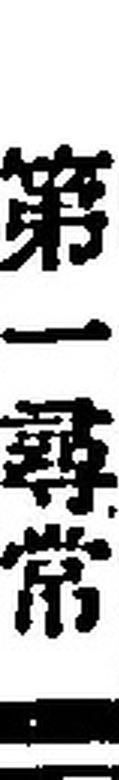第一尋常
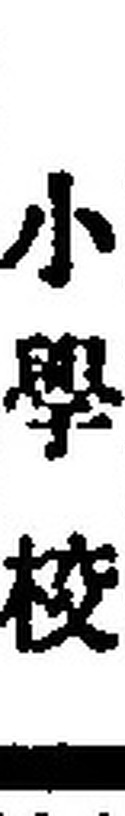小學校
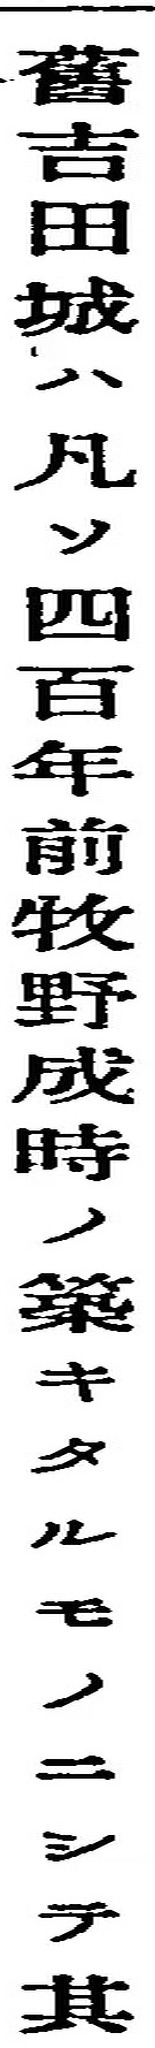舊吉田城舊吉田城ハ凡ソ四百年前牧野成時ノ築キタルモノニシテ其
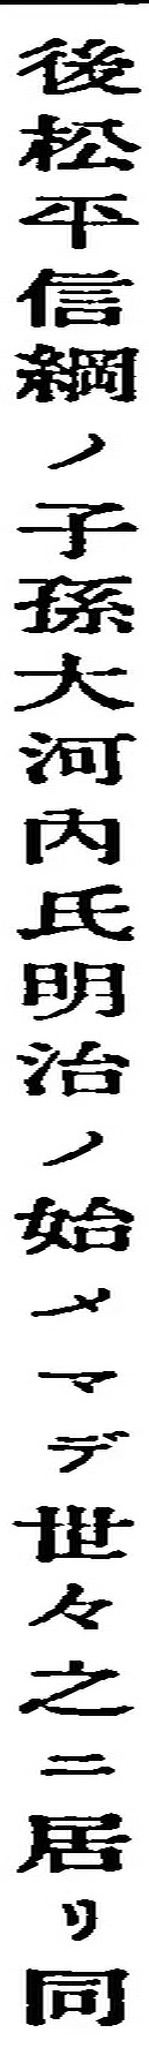後松平信綱ノ子孫大河内氏明治ノ始メマデ世々之ニ居リ同
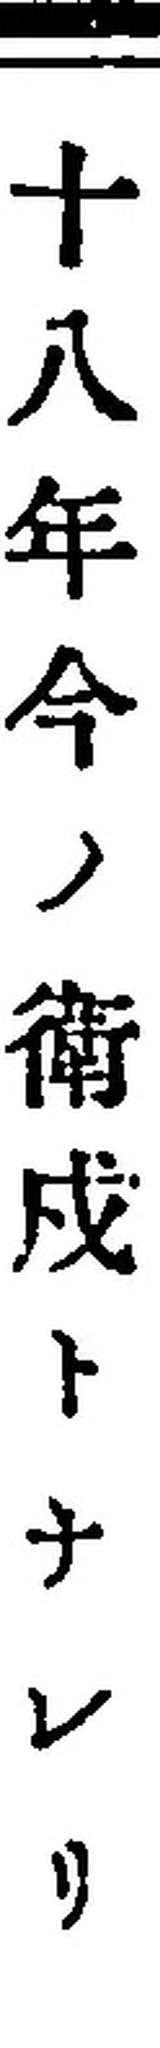十八年今ノ衛戌トナレリ

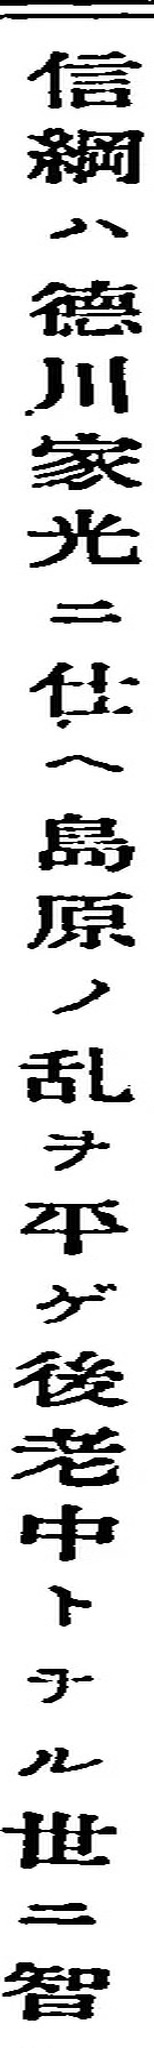松平信綱信綱ハ徳川家光ニ仕ヘ島原ノ乱ヲ平ゲ後老中トナル世ニ智
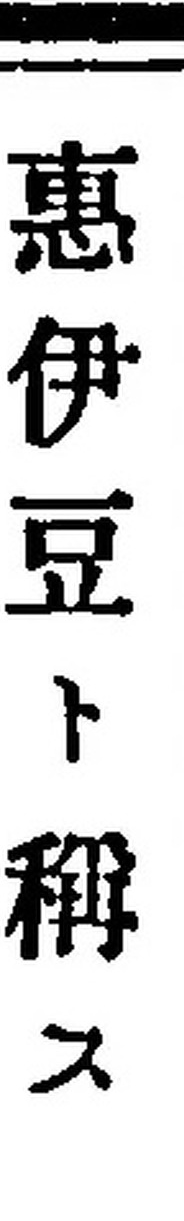惠伊豆ト稱ス
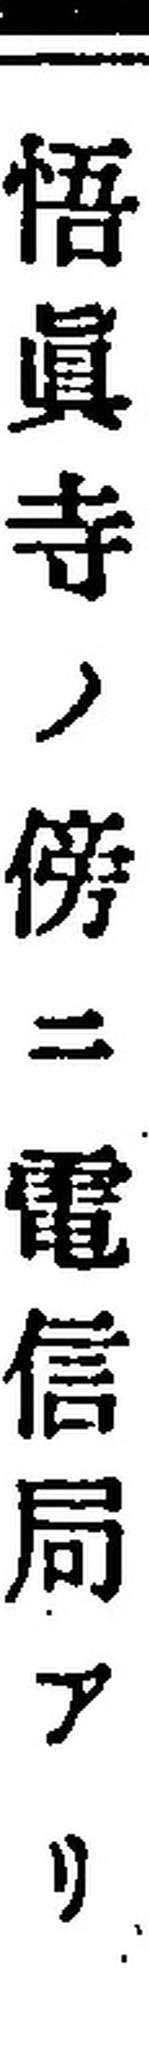悟眞寺悟眞寺ノ傍ニ電信局アリ
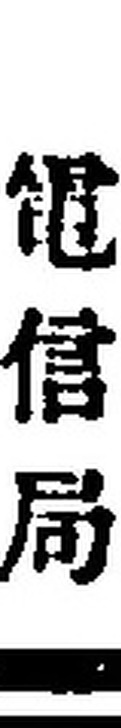電信局
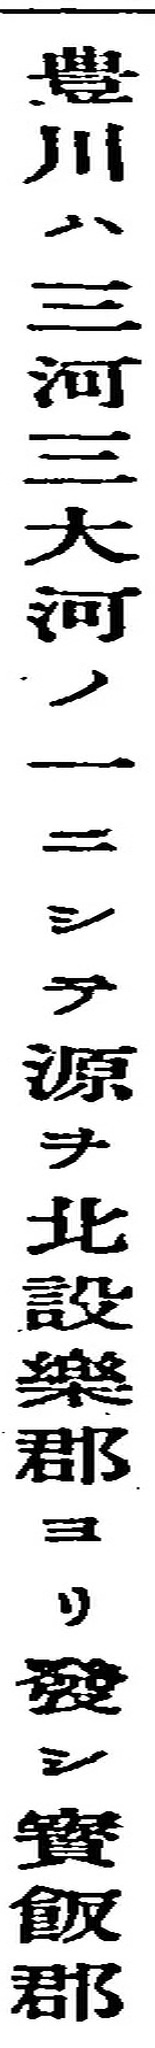豊川豊川ハ三河三大河ノ一ニシテ源ヲ北設樂郡ヨリ發シ寶飯郡
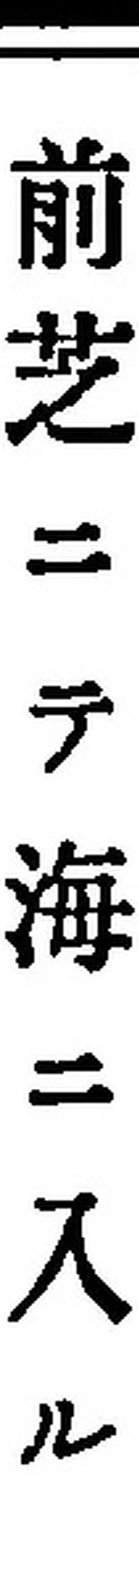前芝ニテ海ニ入ル
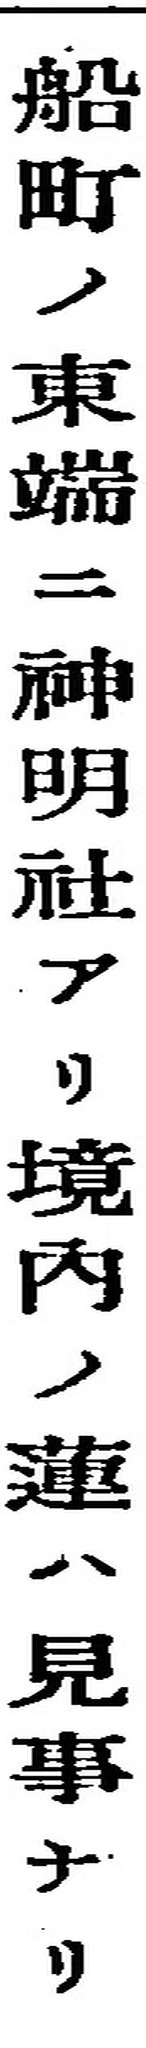神明社船町ノ東端ニ神明社アリ境内ノ蓮ハ見事ナリ
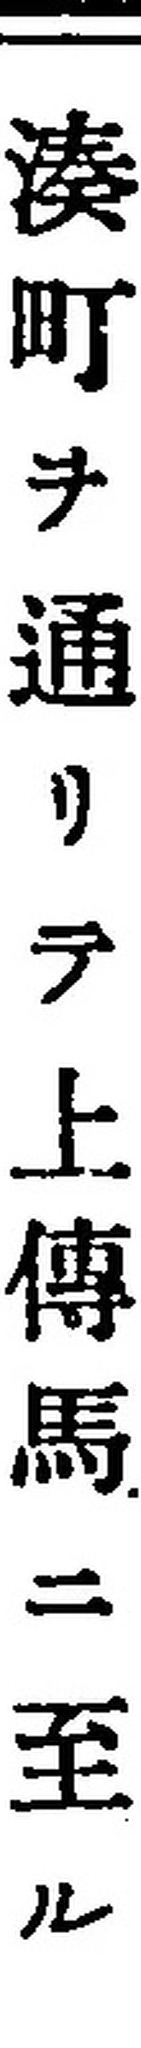湊町湊町ヲ通リテ上傳馬ニ至ル
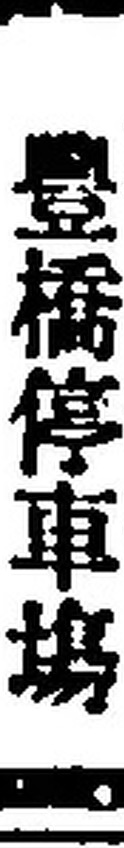豐橋停車場
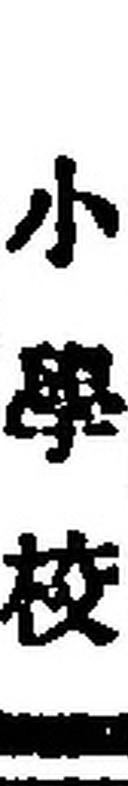小學校
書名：郷土誌
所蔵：国立国会図書館 National Diet Library, JAPAN
